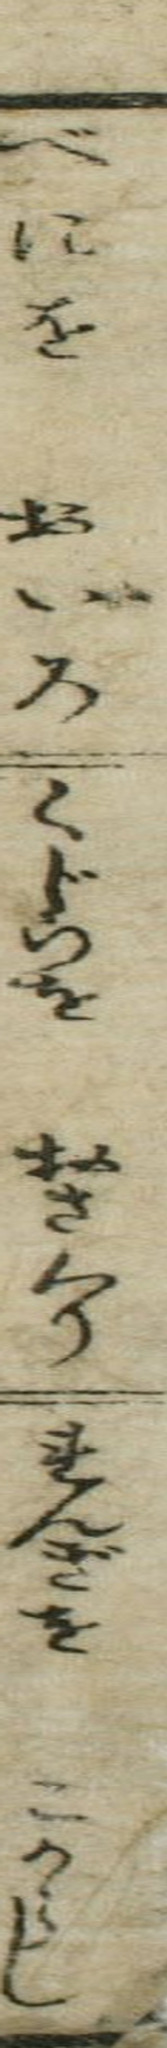べにをおいろくじらをおさくりれんぎをこからし
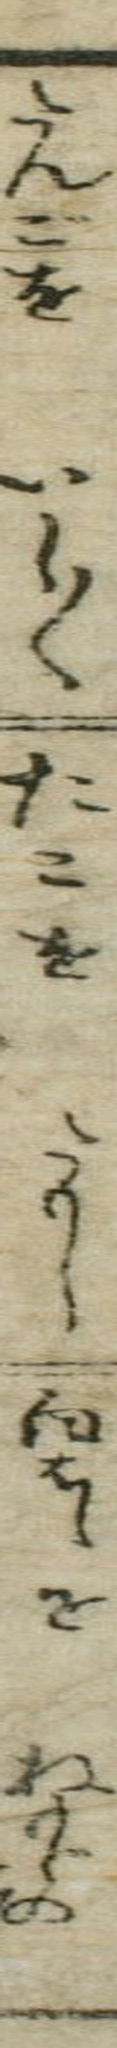たんごをいし〳〵たこをたもし白はしをねもじのはし
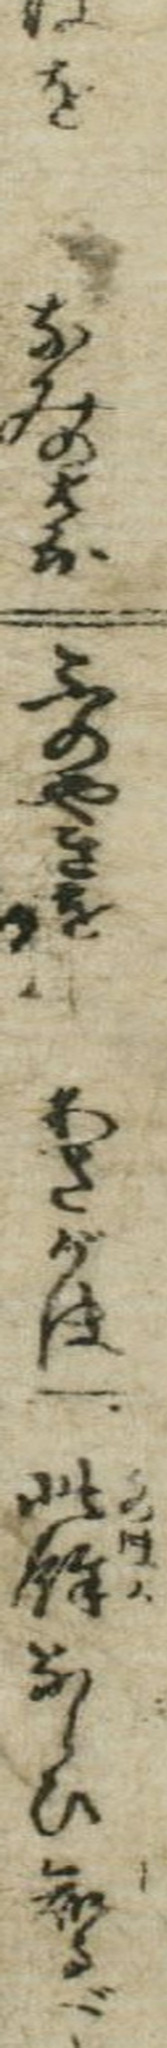しほをなみのはなふのやきをあさがほ此余ならひ知るべし
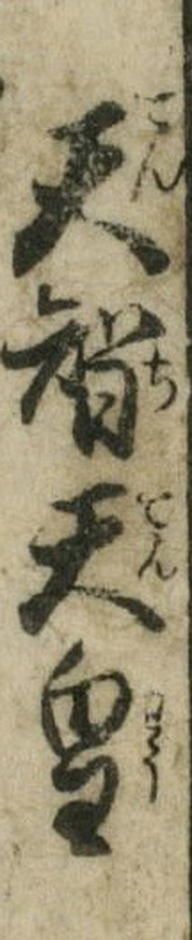天智天皇
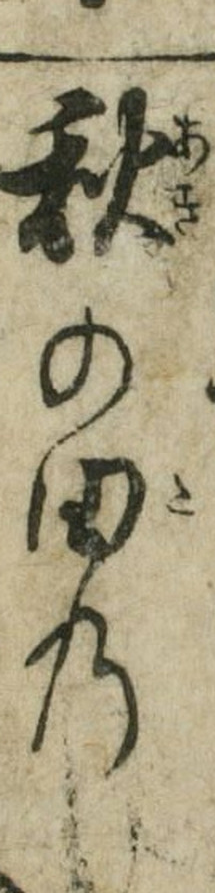秋の田の
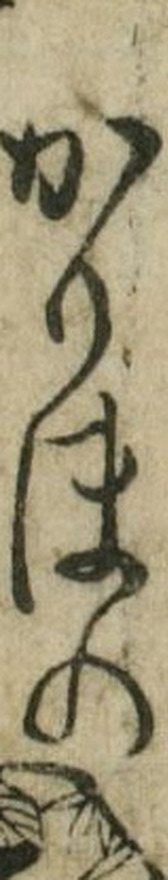かりほの
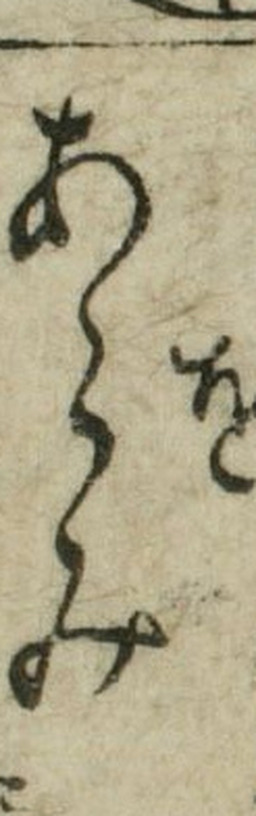あらみ
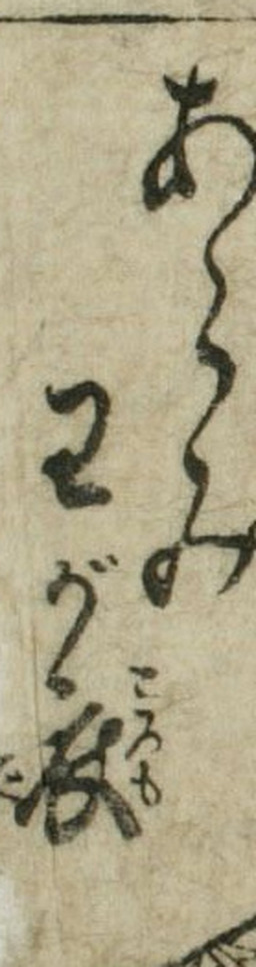わが衣
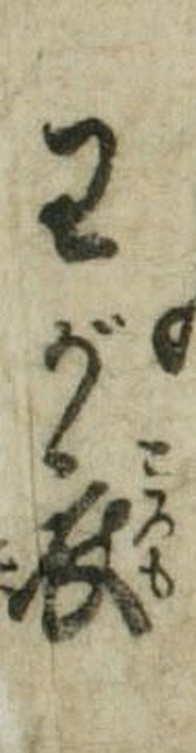わが衣

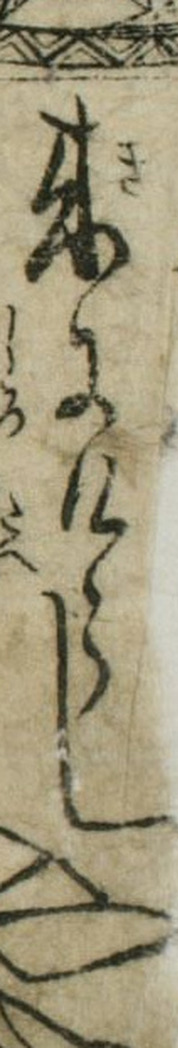来にけらし
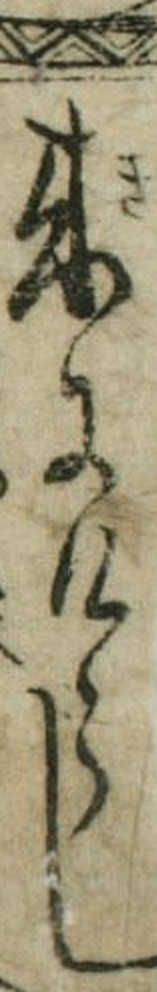来にけらし
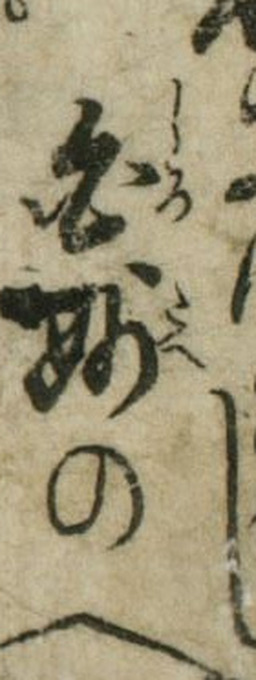白妙の
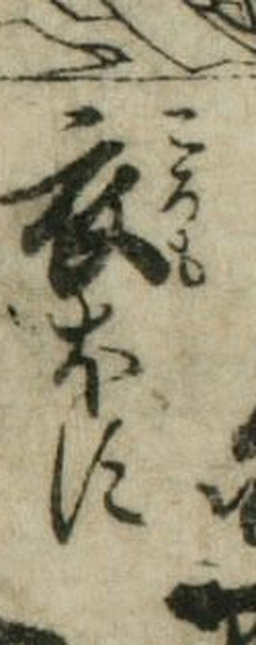衣ほす
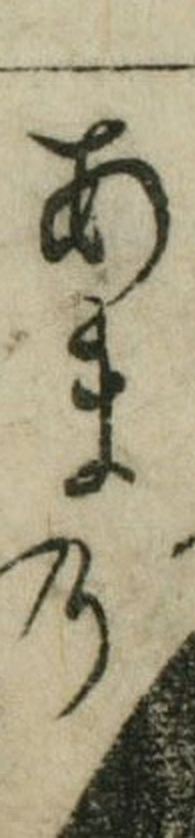あまの
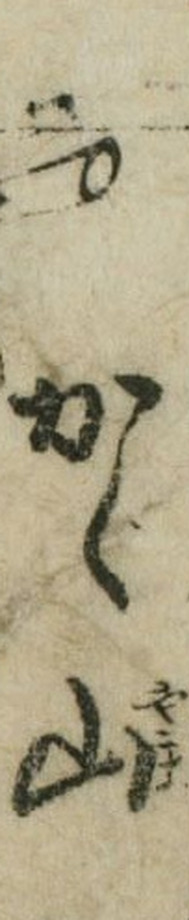かぐ山
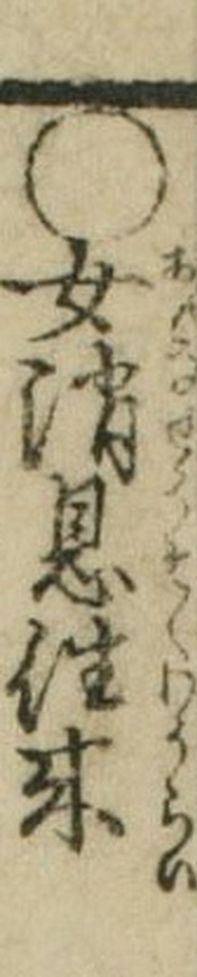○女消息往来
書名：百人一首
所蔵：東京学芸大学教育コンテンツアーカイブ
